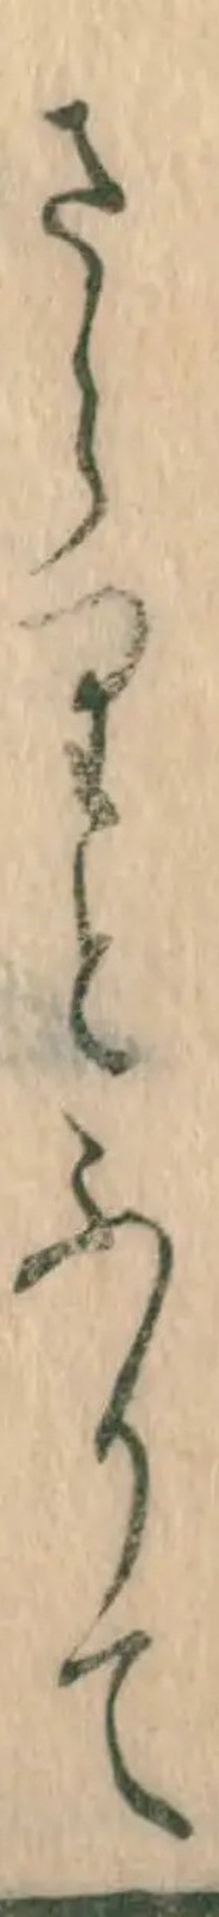さらりとふりて
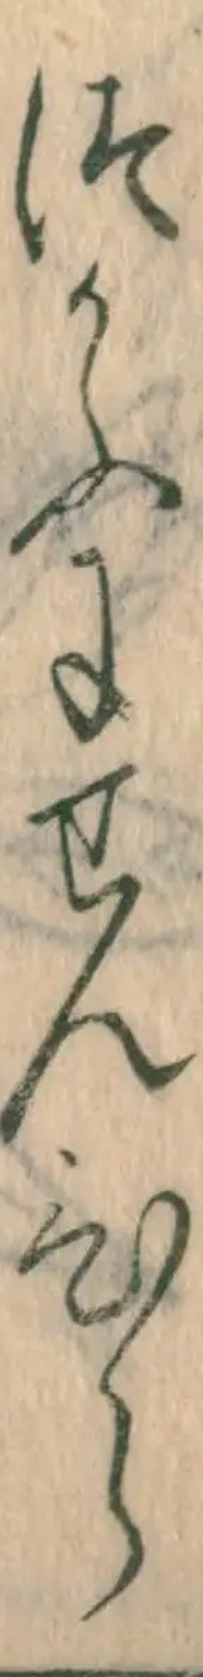つかふにせんひら
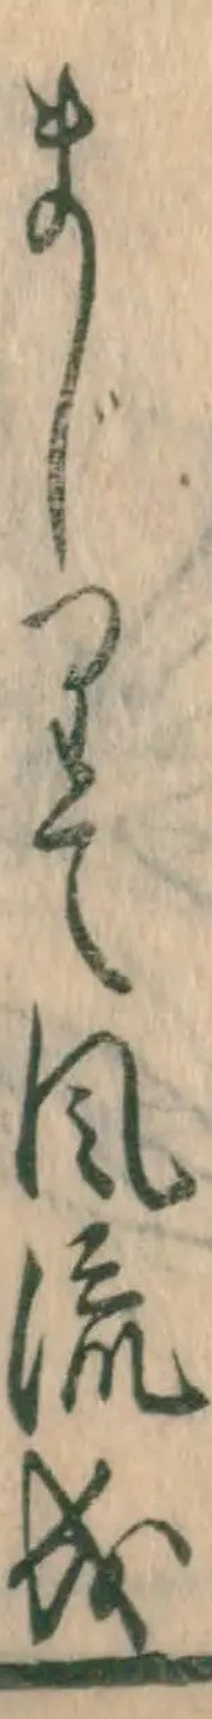まじりて風流成
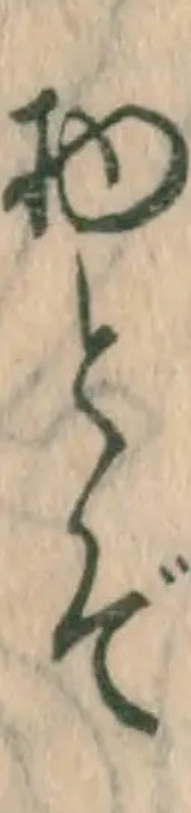物とぞ
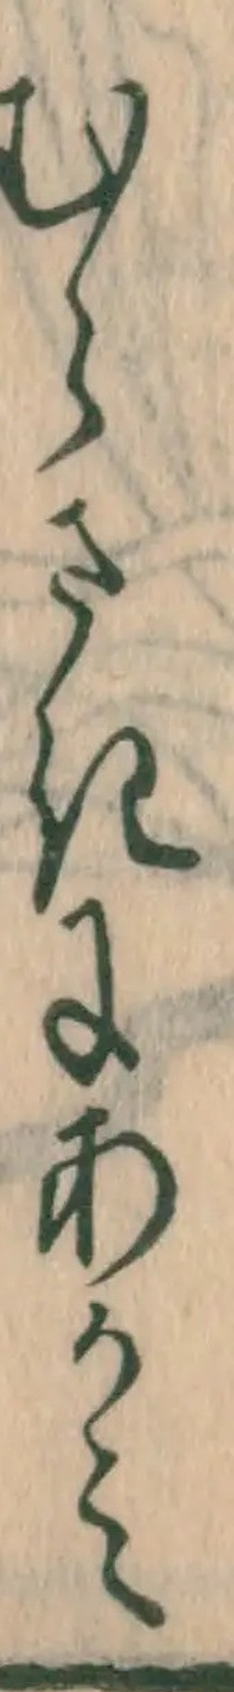むらさきにあかみ
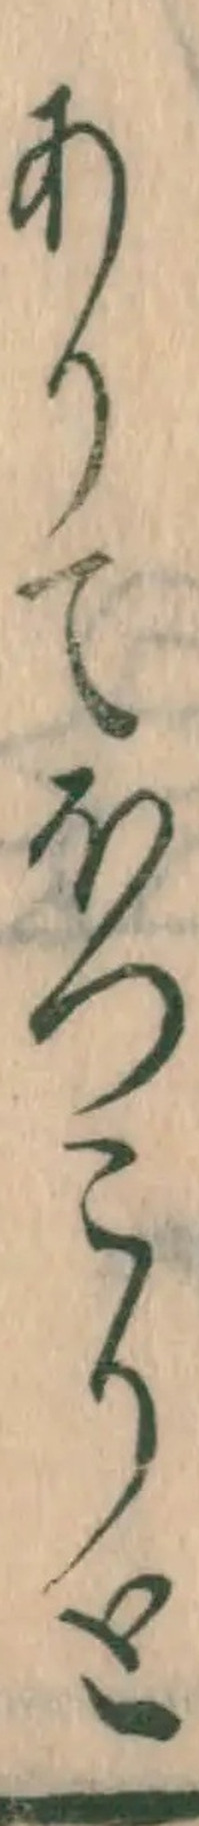ありてほつこりと
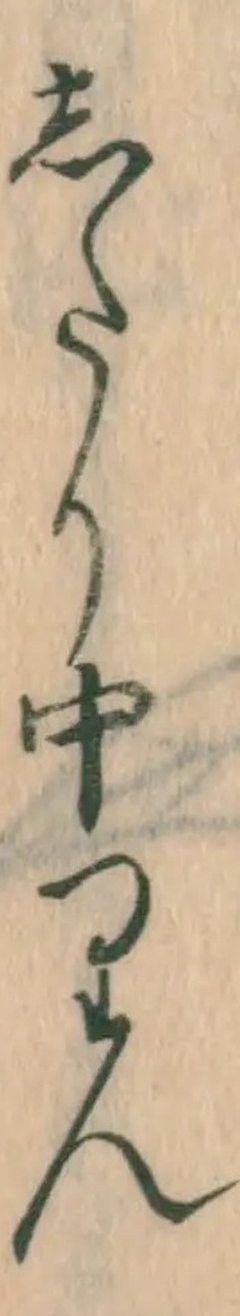したり中りん
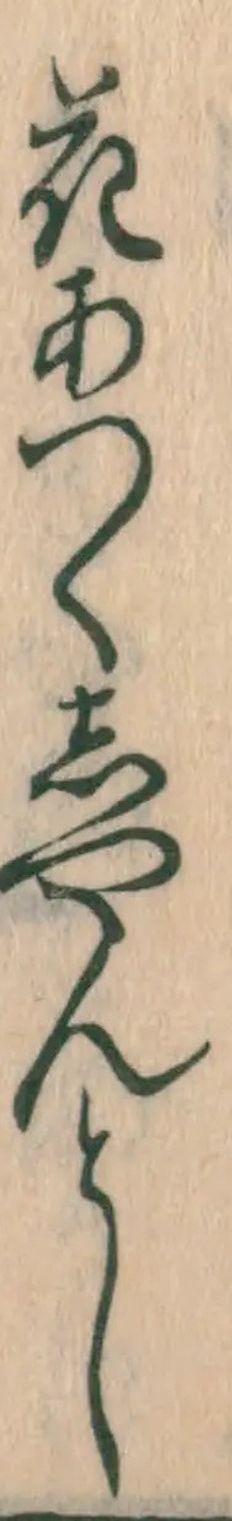花あつくしやんとし
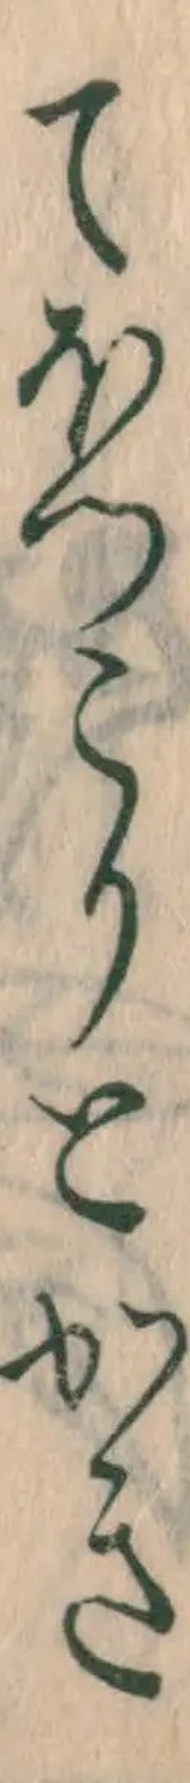てほつこりとかき
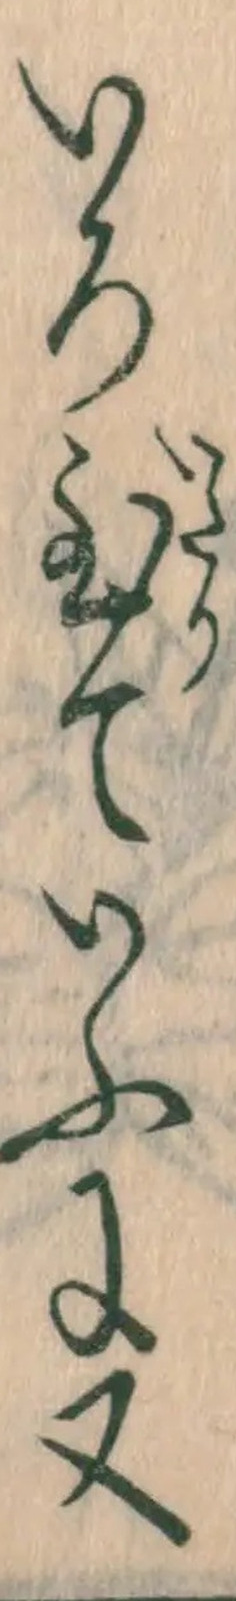いろ至ていふに又
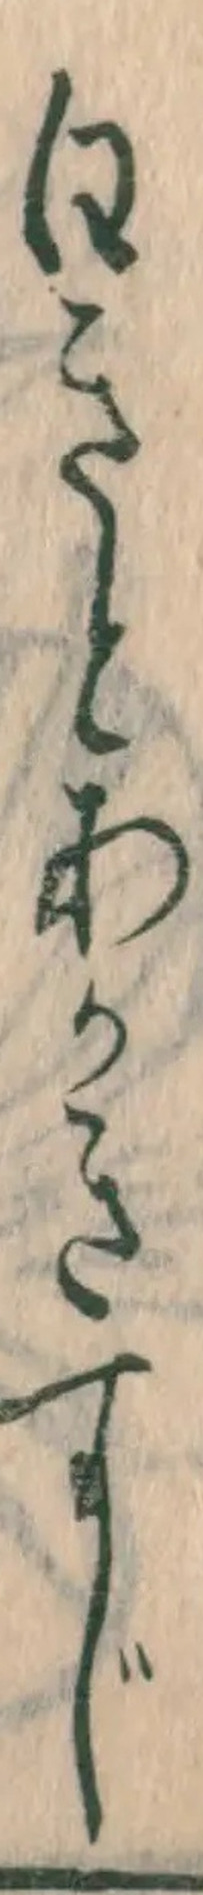白きとあかきすじ
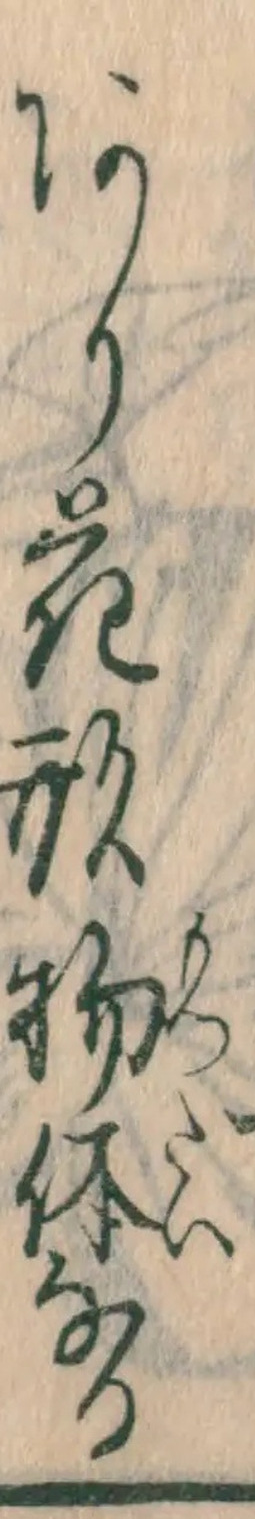なり花形物体なる
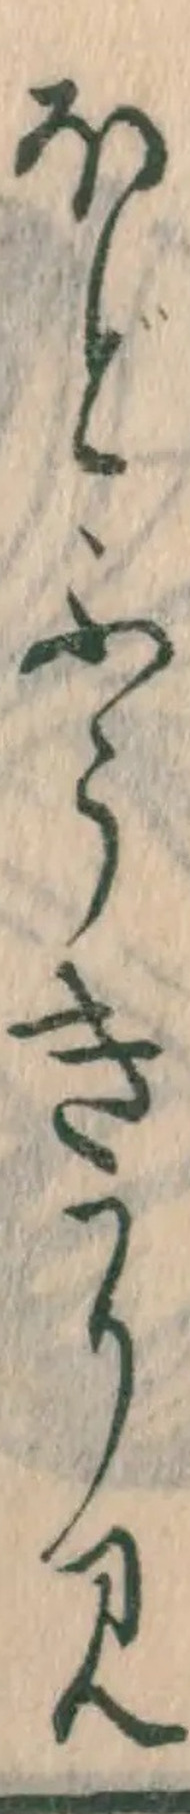ほどふうきに見
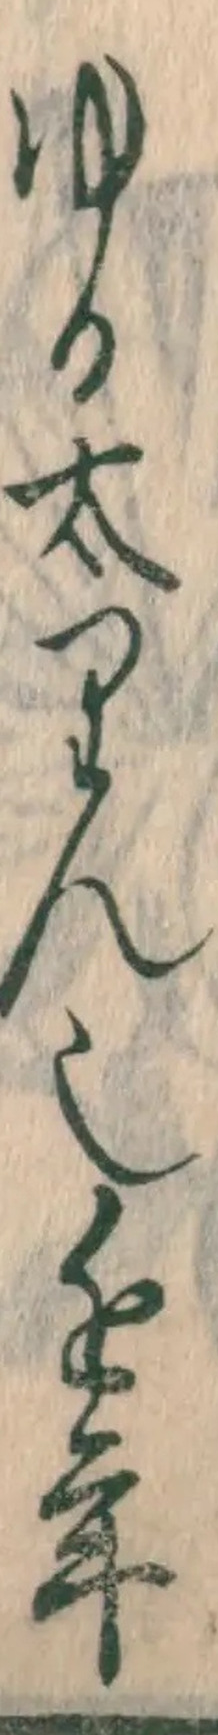ゆる太りん也近年
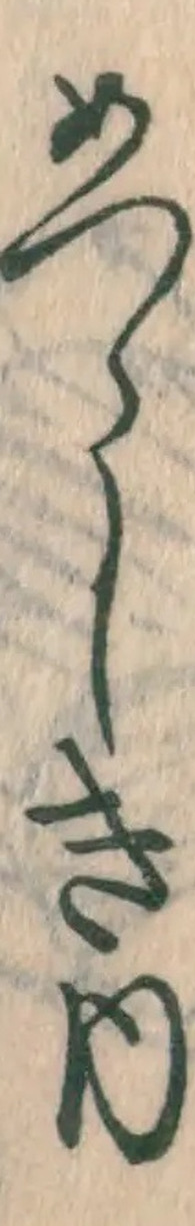めつらしき内

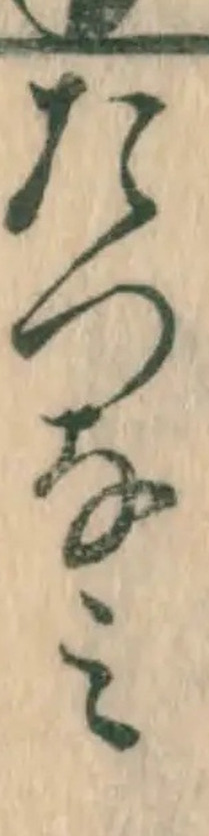たつなみ
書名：錦繍枕 5巻. [5]
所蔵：国立国会図書館 National Diet Library, JAPAN
